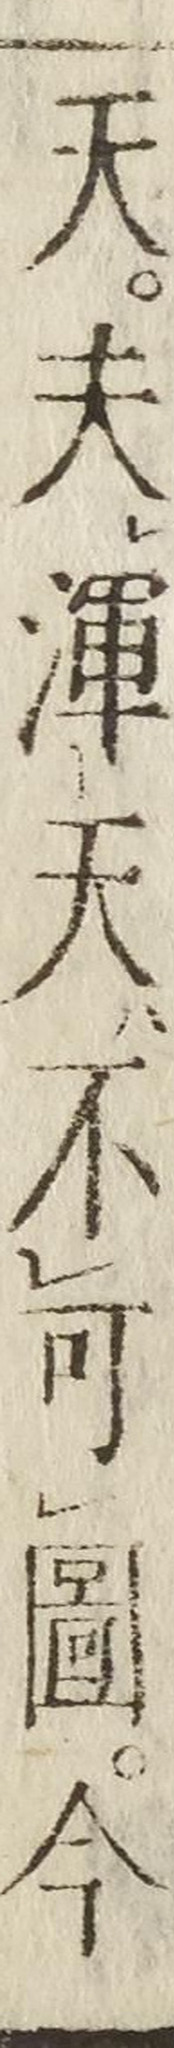天。夫渾ー天不可図。今
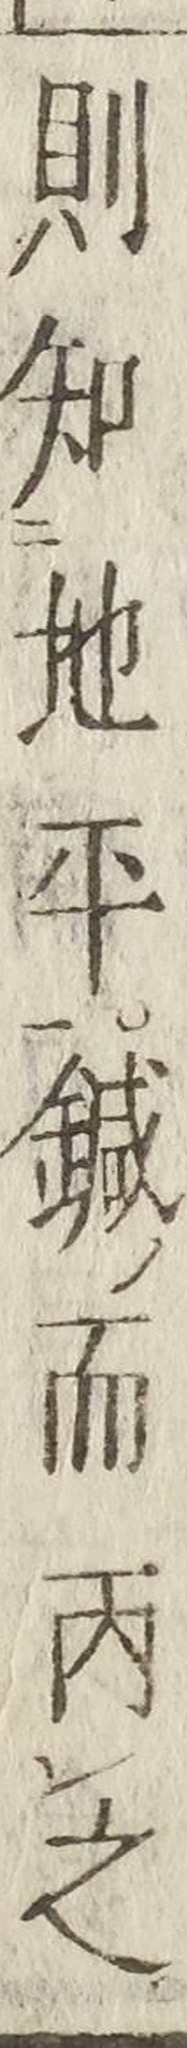則知地平。鍼而丙之。
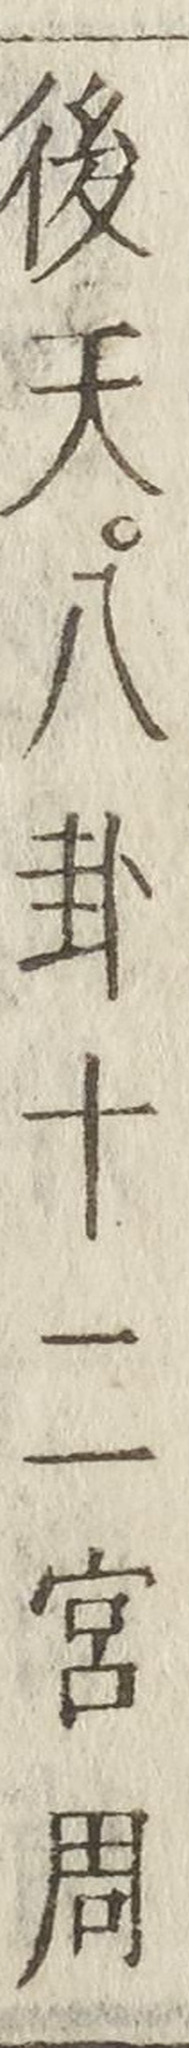後天。八卦十二宮周
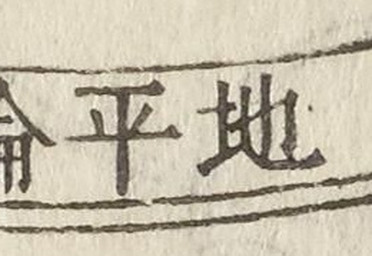地平輪
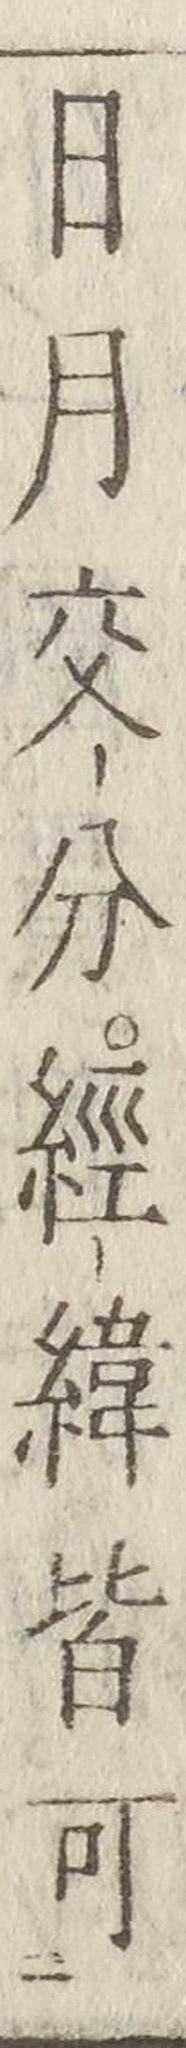日月交ー分。経ー緯皆可
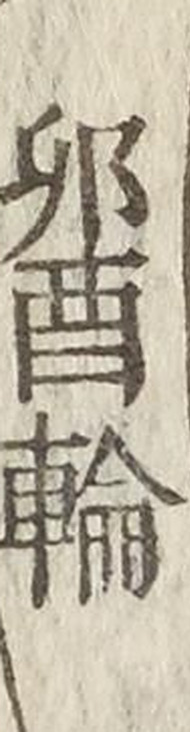卯酉輪

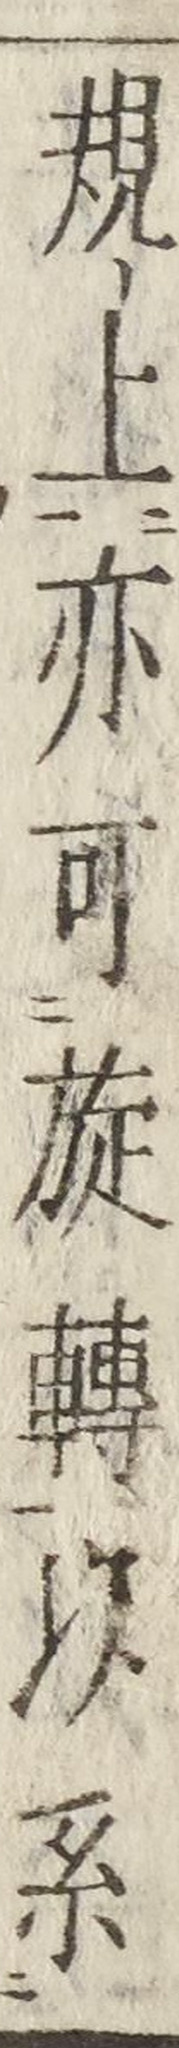規ー上亦可旋転以系
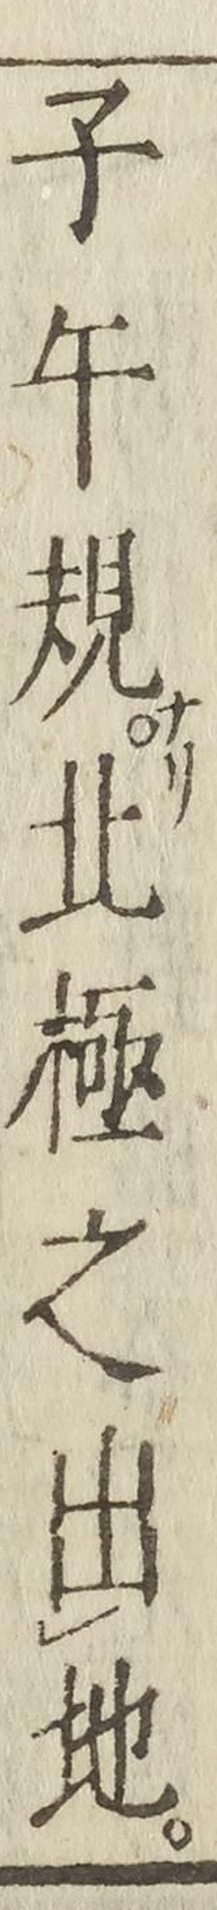子午規。北極之出地。
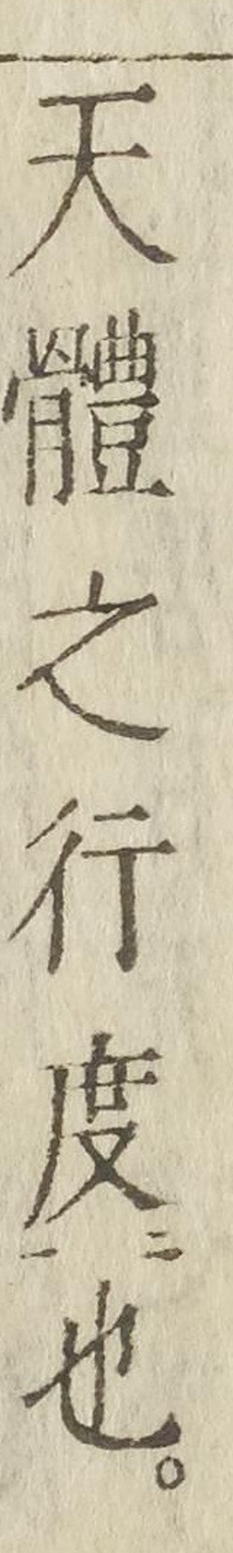天体之行度也。

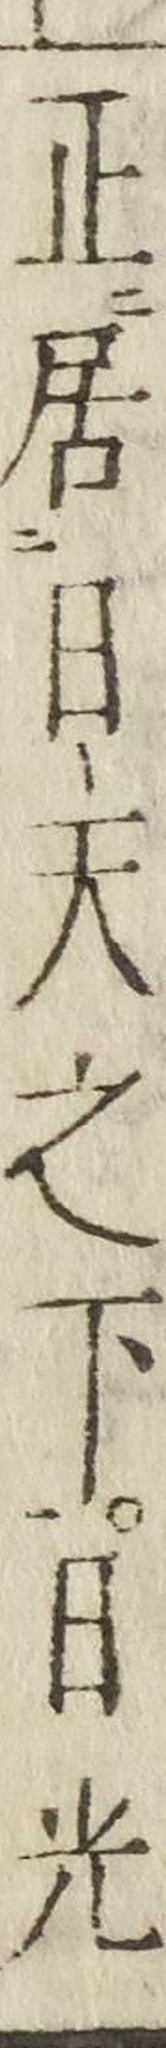正居日ー天之下。日光
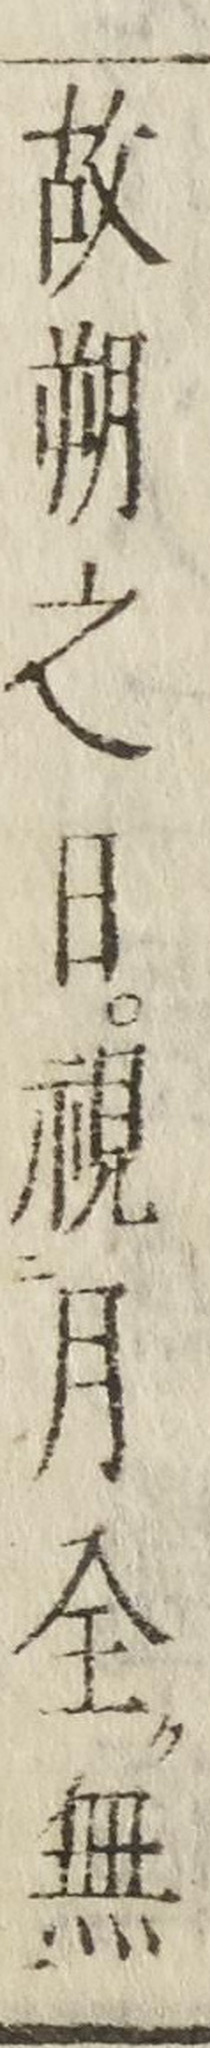故朔之日。視月全無
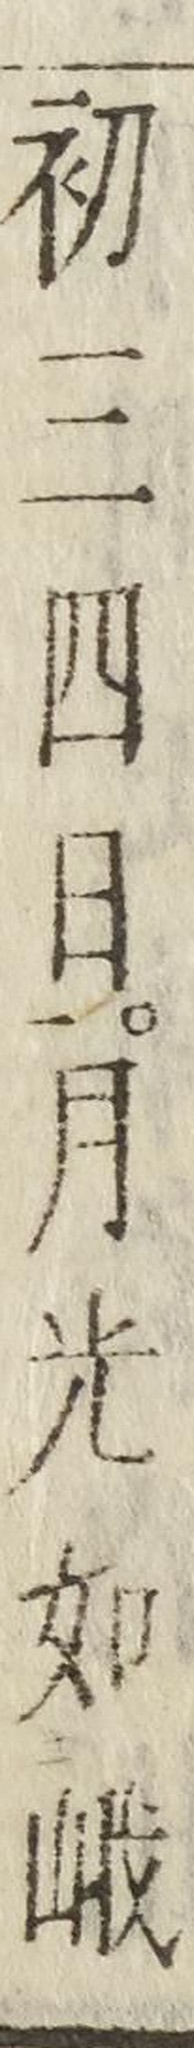初三四日。月光如峨
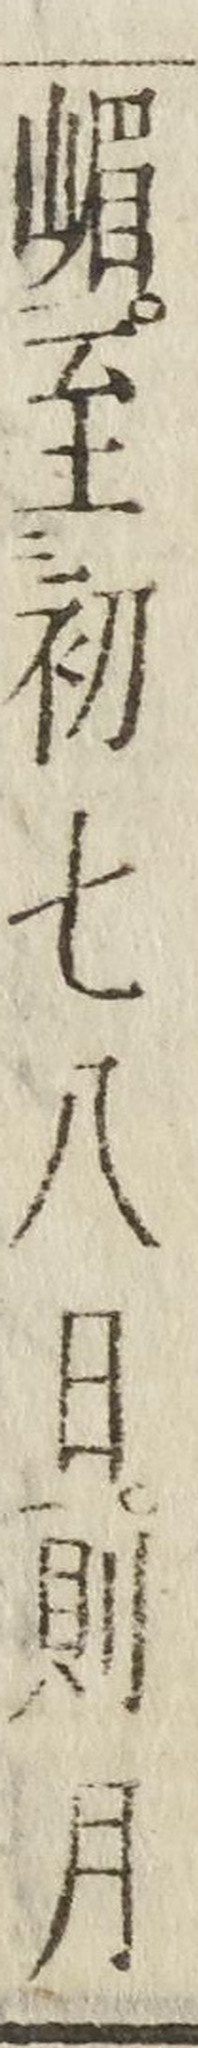嵋。至初七八日。則月
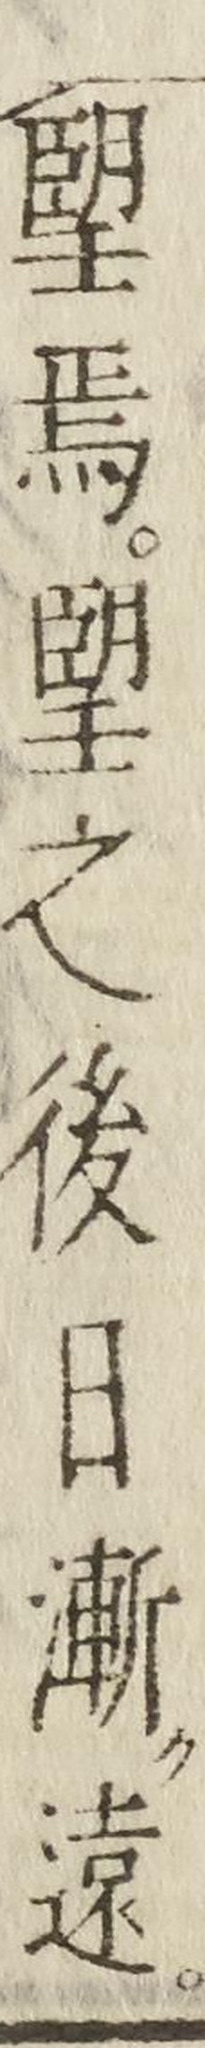望焉。望之後日漸遠。
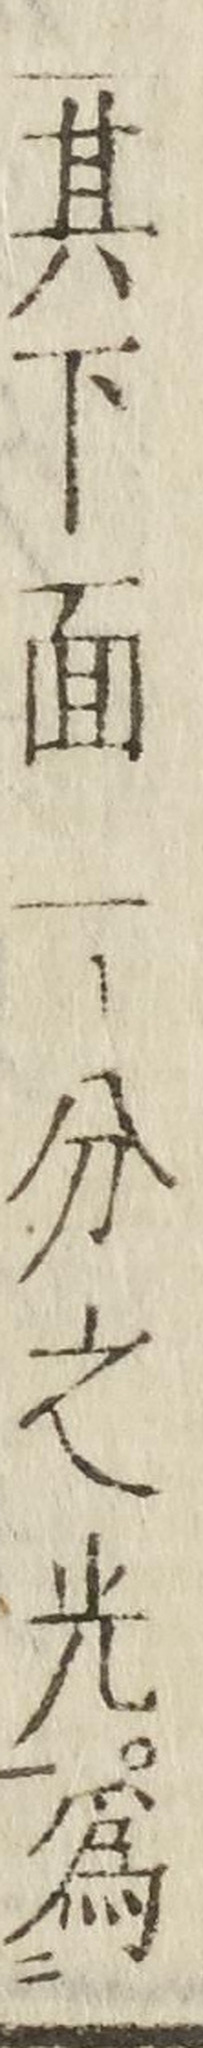其下面一ー分之光。為
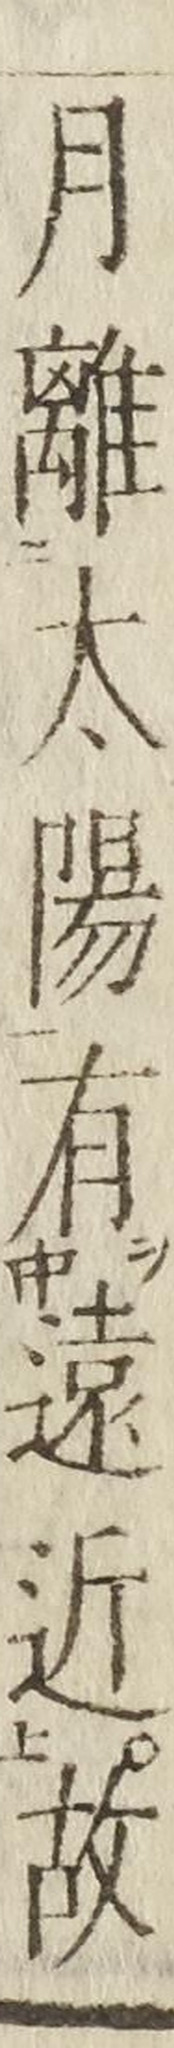月離太陽有遠近。故
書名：天經或問　序圖
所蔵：東京大学地震研究所図書室 Earthquake Research Institute Library, The University of Tokyo, JAPAN
